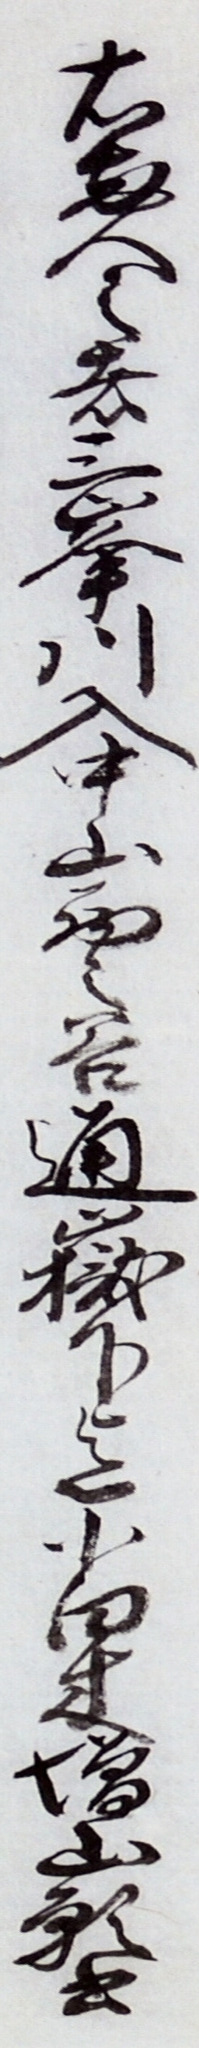右両人之者三峯川入中山西之谷通岳下迄小白木増山願書
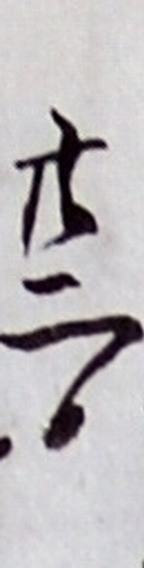廿二日
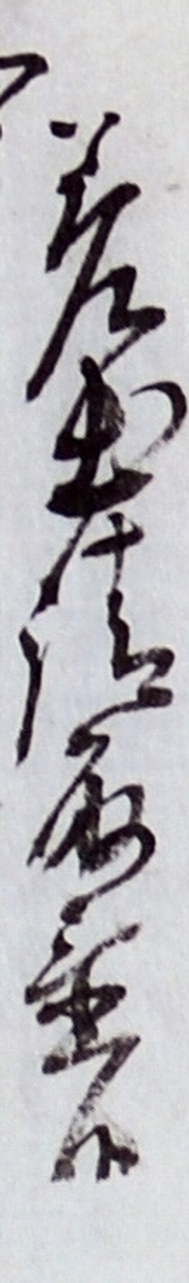差出請取置候
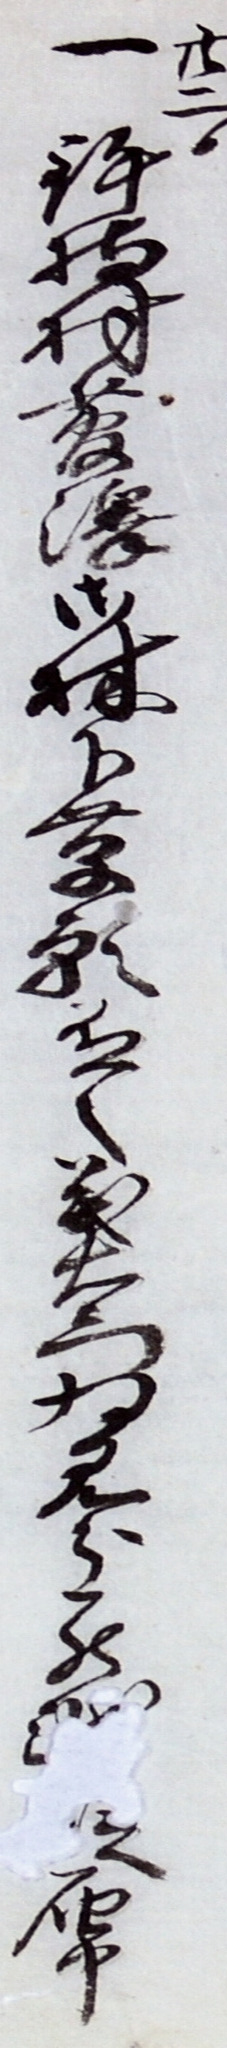一鉾持村菅澤御林下草願有之義右衛門為見分罷届中
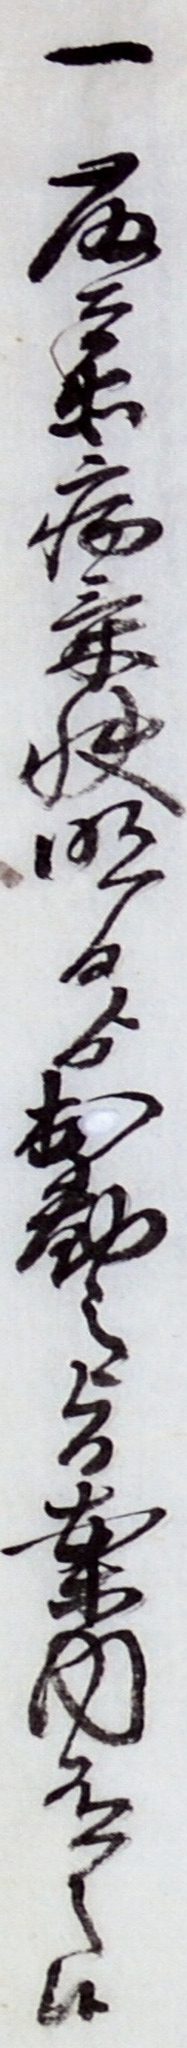一藤兵衛病気快明日より出勤之旨案内有之候

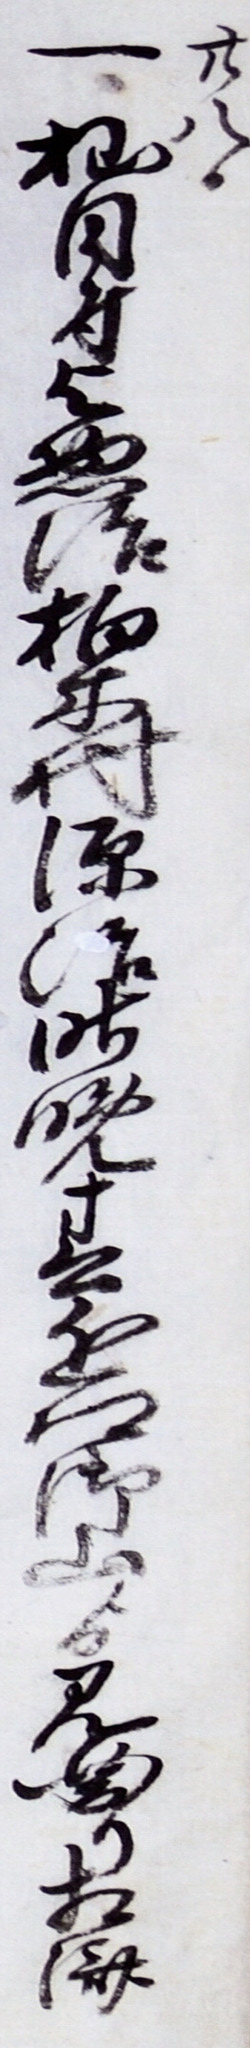一杣目付与惣治柏木村源治昨晩春近郷御山より見図り相済
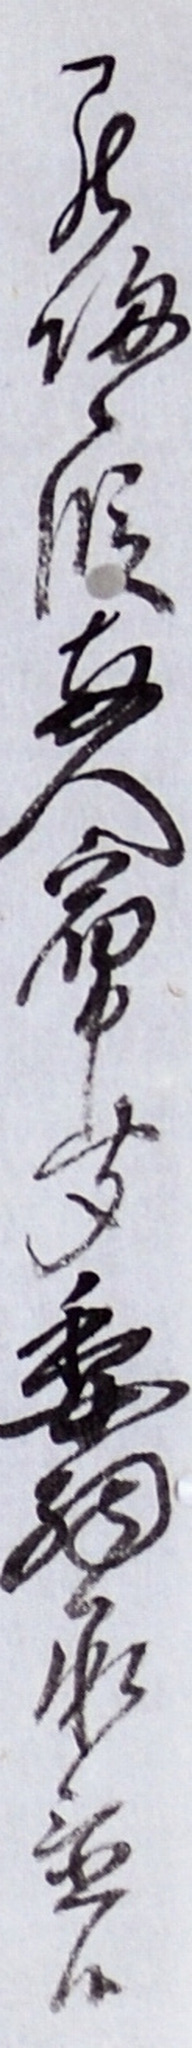罷帰候段両人宿申聞委細承置候
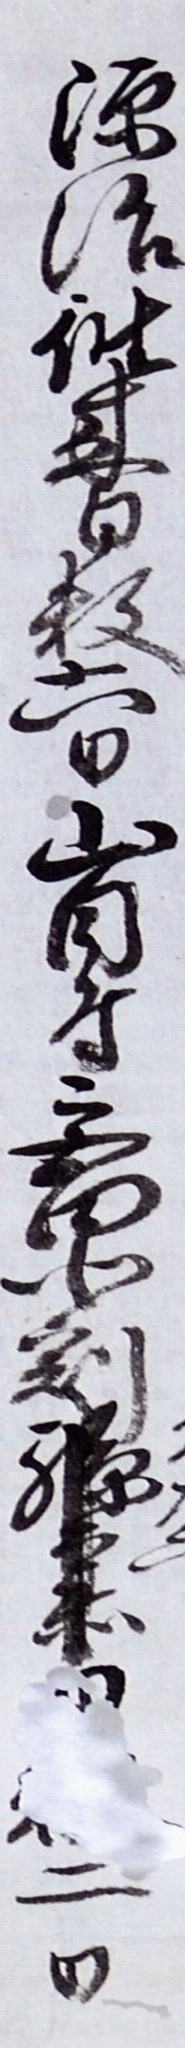源治往来日数六日山目付宮田北割源兵衛二日
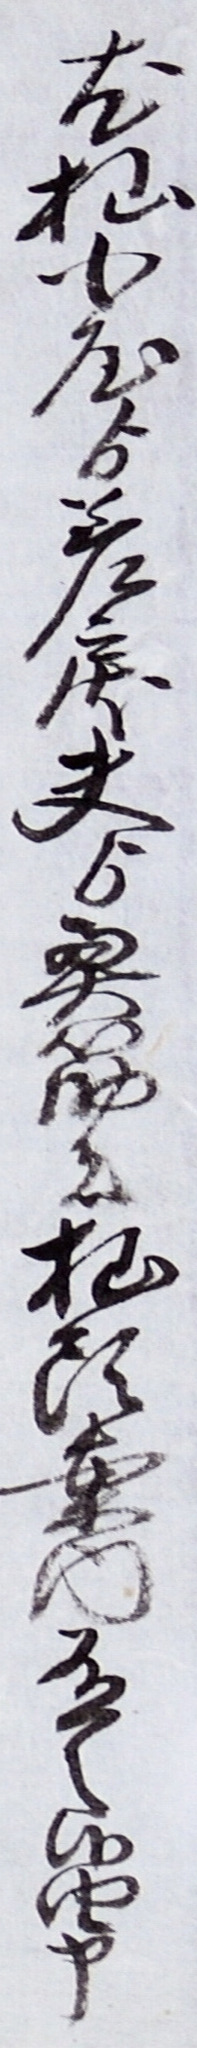尤杣小屋より差戻夫より奥筋は杣頭案内有之候由申
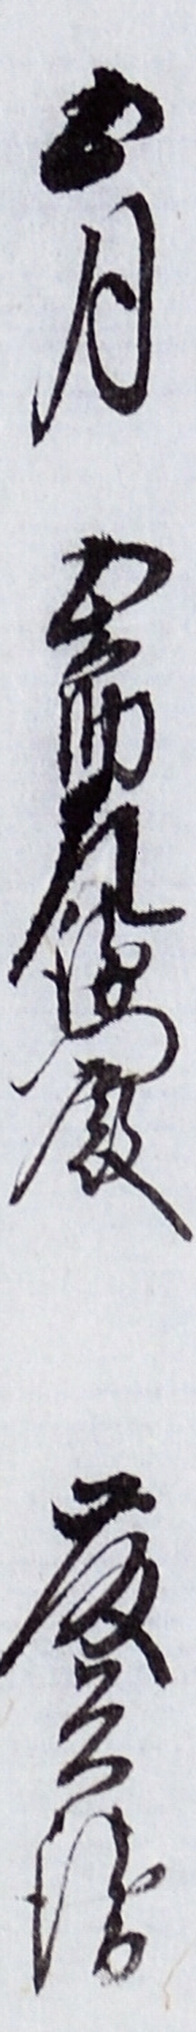五月吾助左衛門殿藤兵衛
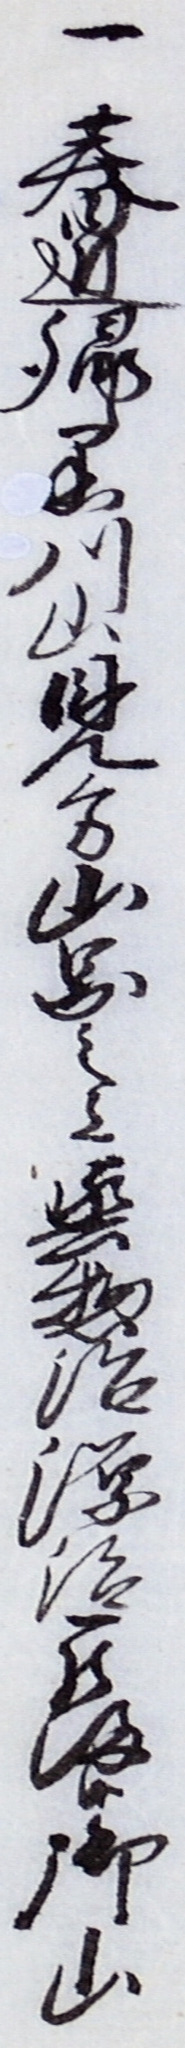一春近郷黒川山見方山図之上与惣治源治罷帰候御山
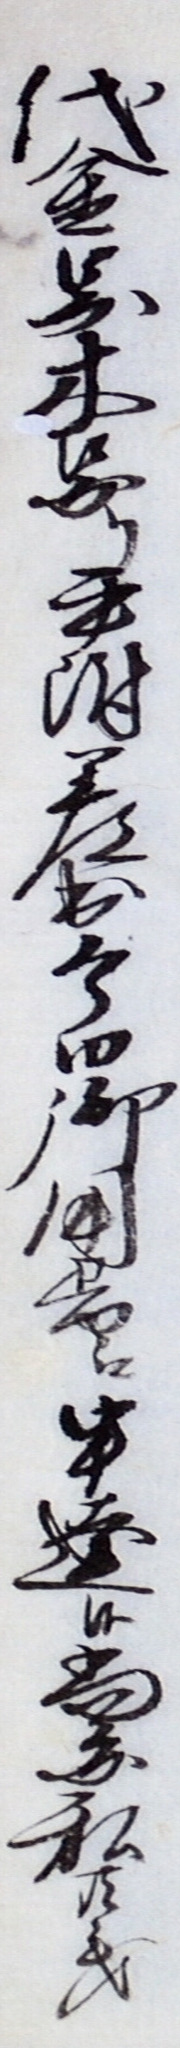代金図木図り書附差出今日御用番江申達候尚亦私共義
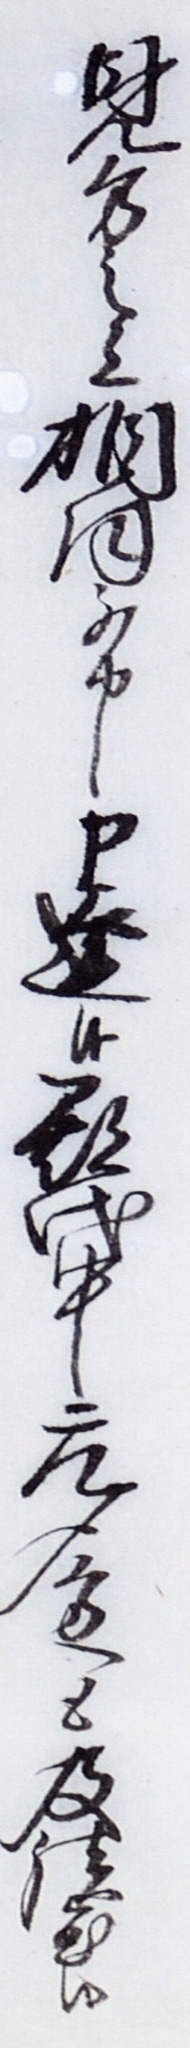見分之上相伺可申申達候郡代中元〆方へも及談置候
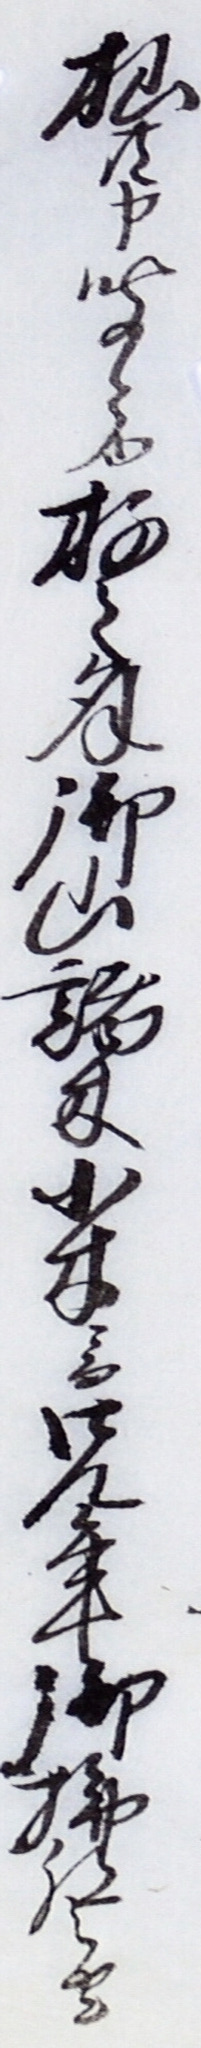杣共申聞候而存之外御山諸木小木ニ而先年御払役より
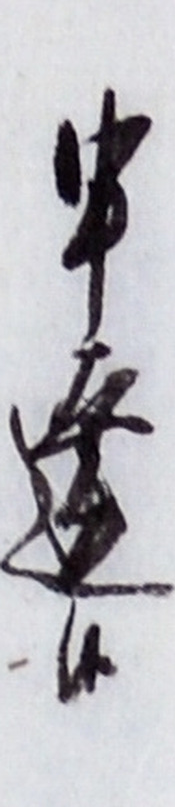申達候
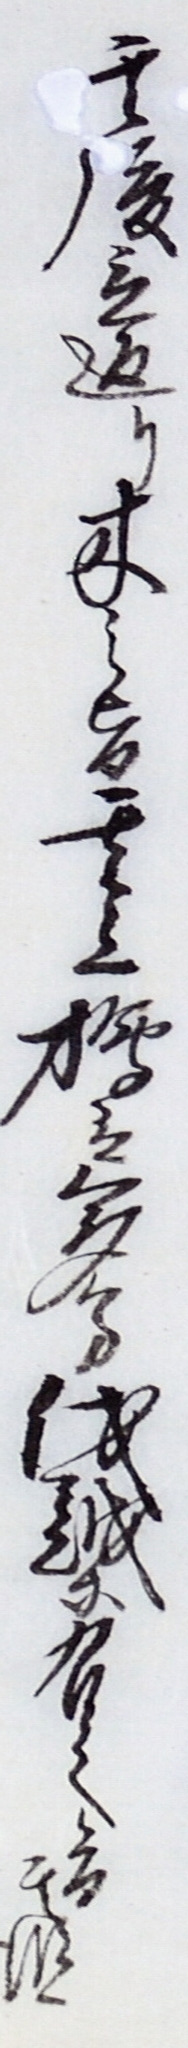其後立返り木之旨其上檜は多分伐越等有之候間其段
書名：御山奉行御用控
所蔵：伊那市立高遠町図書館・合同会社AMANE
